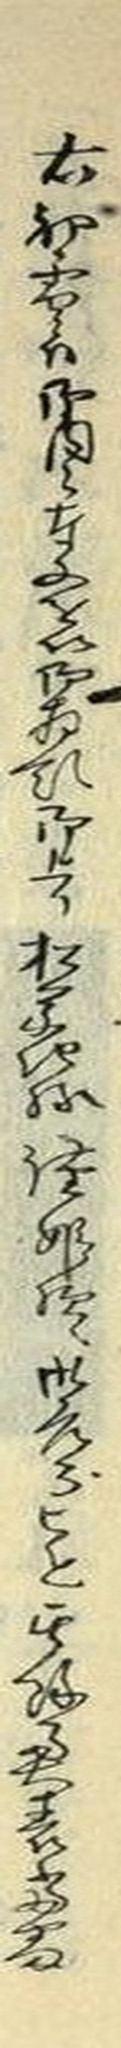右初雪ニ付御内々奉文を以御拝領御上り松栄院様謹姫様へ御取分被進其余奥表当番
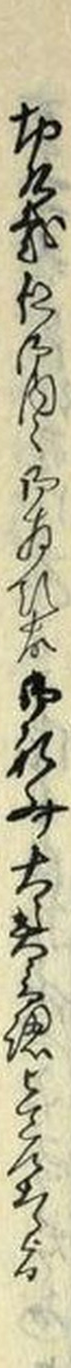切頂戴但御内々御拝領故御礼文大奥ニ而認被差出候旨
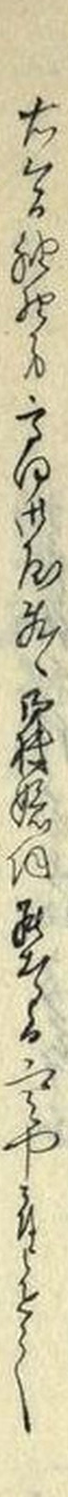右今日袖野方高田御屋敷へ御機嫌伺罷出候旨寒中ニ付被進之
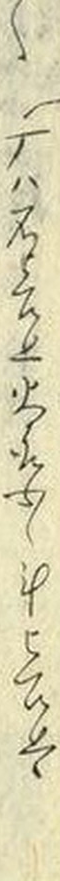雁ハ不召上火取ふし斗被召上候
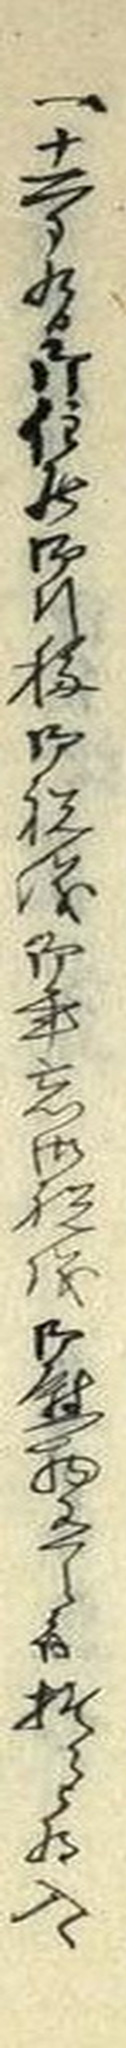一十二月九日御住居御引移御祝儀御年忘御祝儀御慰者有之候ニ付折々被為入
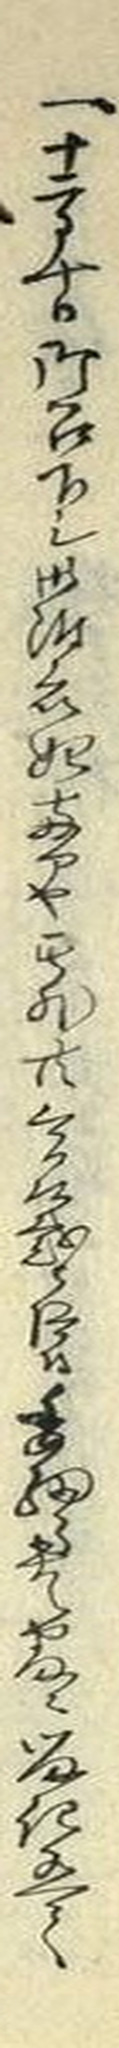一十二月十日御召下シ御附衆始両部屋其外共今日頂戴被仰付委細奥之番ニ留記有之
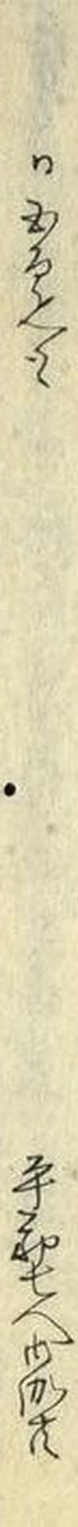同五百疋ツヽ平勤七人御伽共
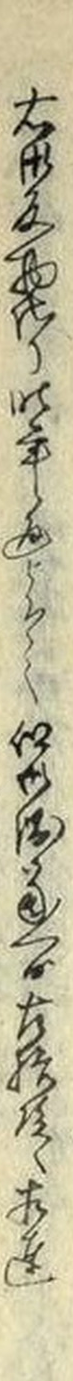右御反物代り昨年之通被下之但御側御用人ゟ左膳殿へ相達
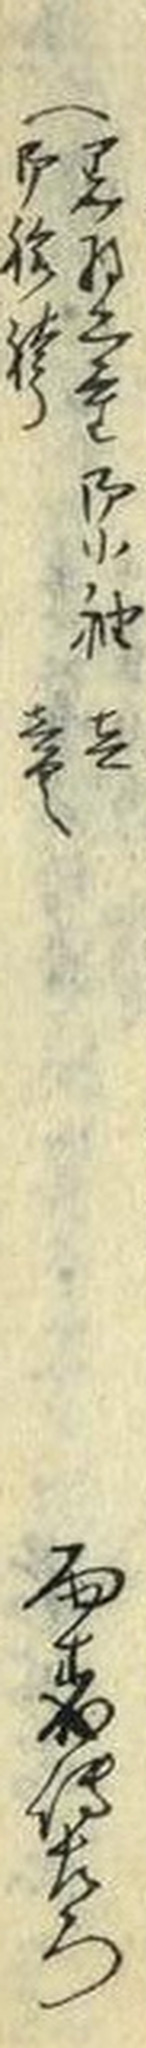御袷袴壱具雨森伝左衛門
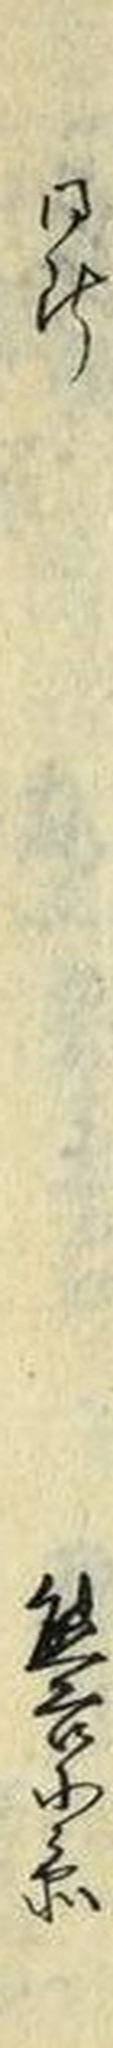同断熊谷小兵衛

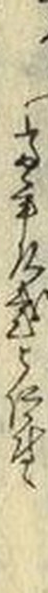限故頂戴被仰付候
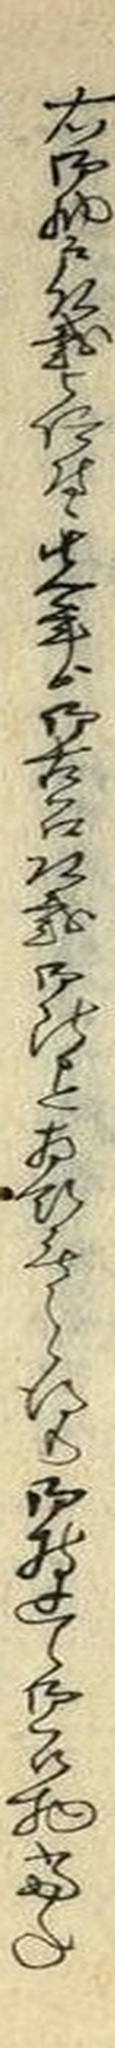右御納戸頂戴被仰付候先年ゟ御古召頂戴御断申上拝領無之候得共御持込之御召物当年
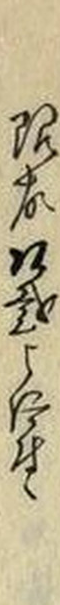限故頂戴被仰付候
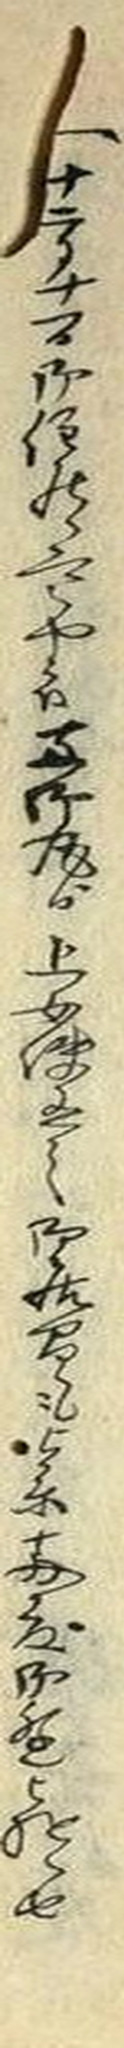一十二月十一日御住居へ寒中ニ付両御丸ゟ上女使有之御居間へも被参両度御逢被遊候由
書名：少傅日録抄（斉善付側向頭取日記、在府）
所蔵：福井県文書館 Fukui Prefectural Archives
